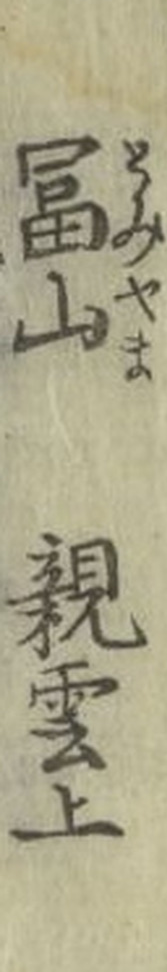冨山親雲上
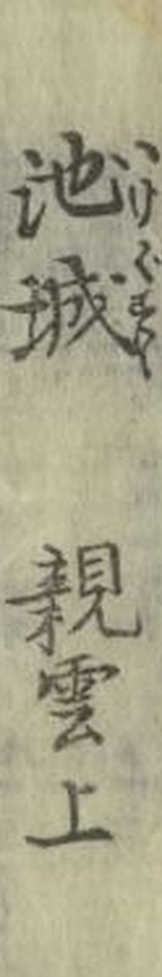池城親雲上
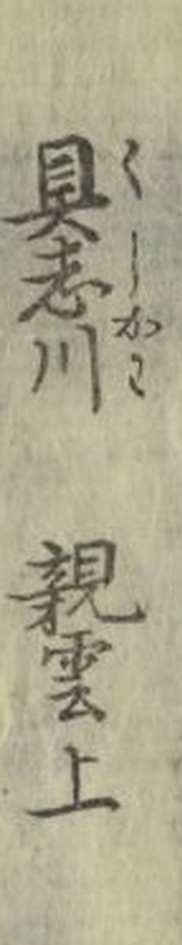具志川親雲上
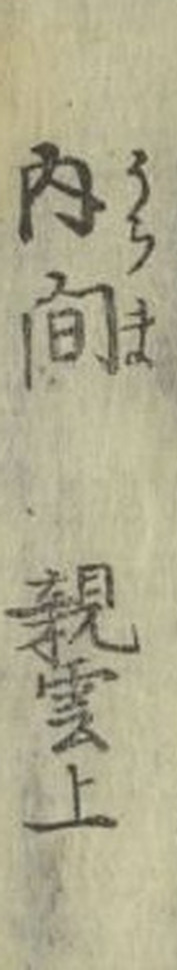内間親雲上
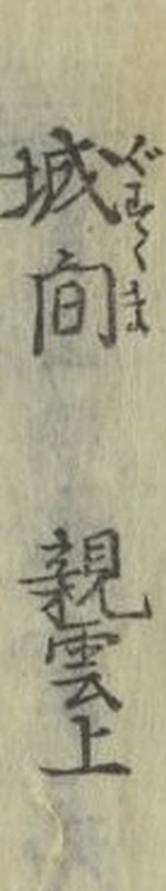城間親雲上
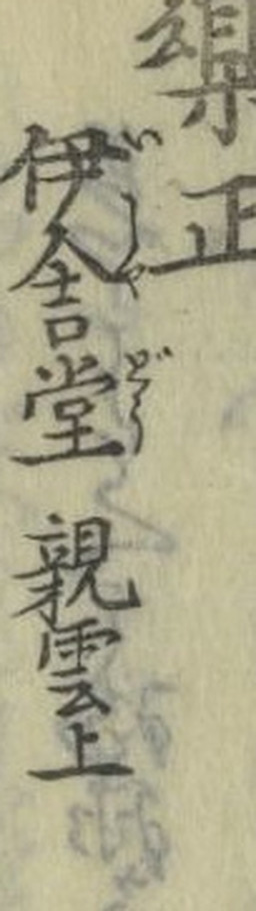伊舎堂親雲上
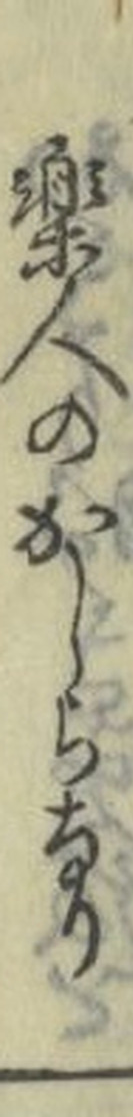樂人のかしらなり
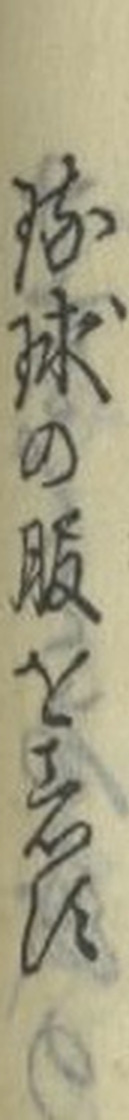琉球の服を着す
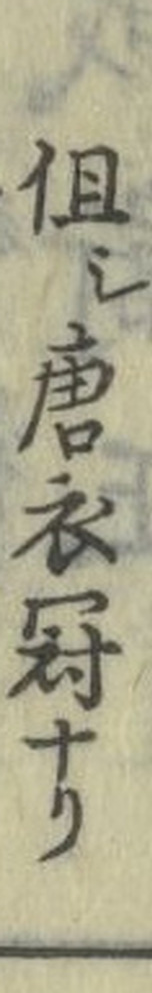但唐衣冠ナリ
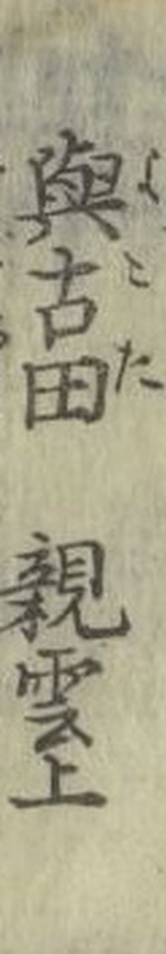與古田親雲上
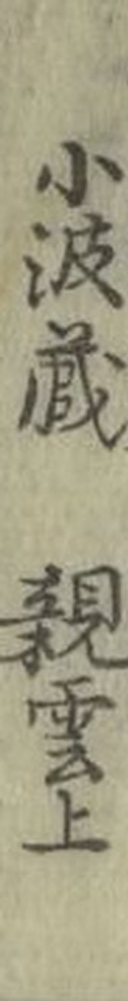小波蔵親雲上

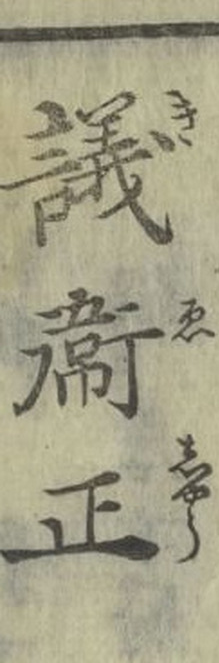議衛正
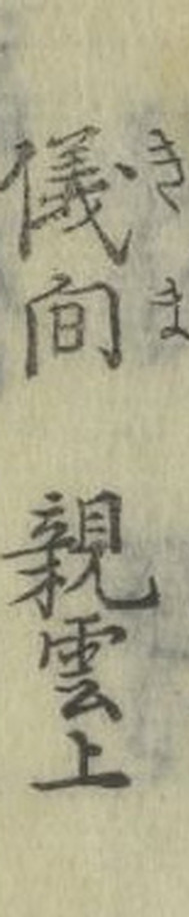儀間親雲上
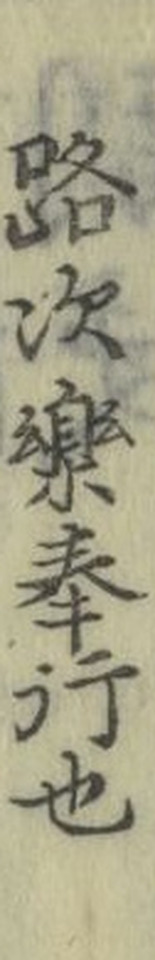路次樂奉行也
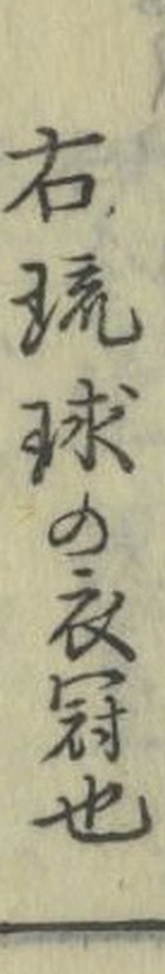古琉球の衣冠也
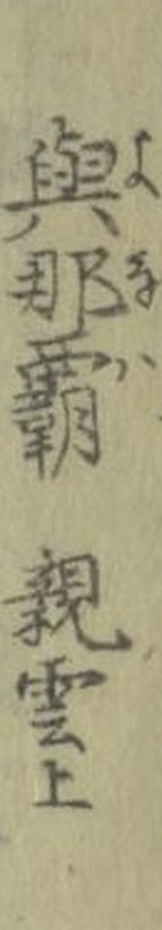與那覇親雲上
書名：琉球人行列記
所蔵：University of the Ryukyus Library
